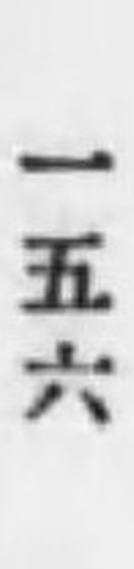一五六
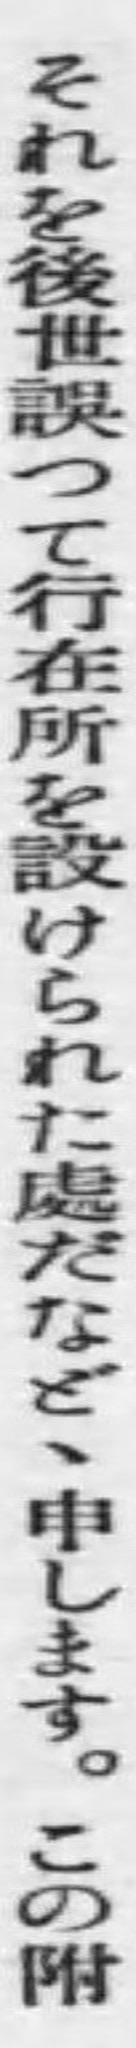それを後世誤つて行在所を設けられた処だなどゝ申します。この附
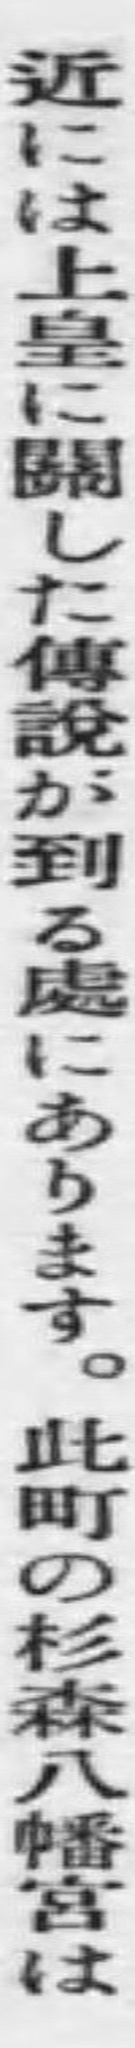近には上皇に関した伝説が到る処にあります。此町の杉森八幡宮は
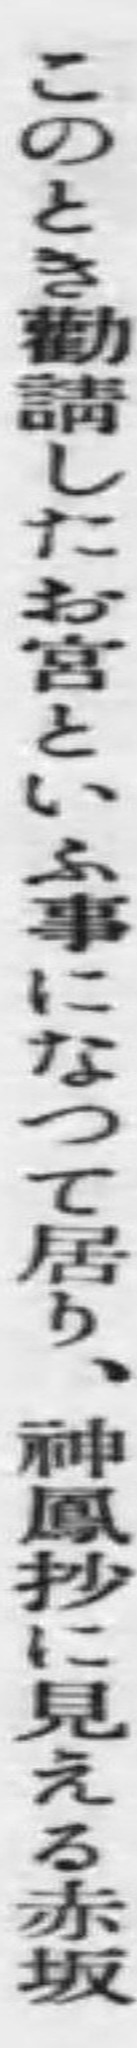このとき勧請したお宮といふ事になつて居り、神鳳抄に見える赤坂
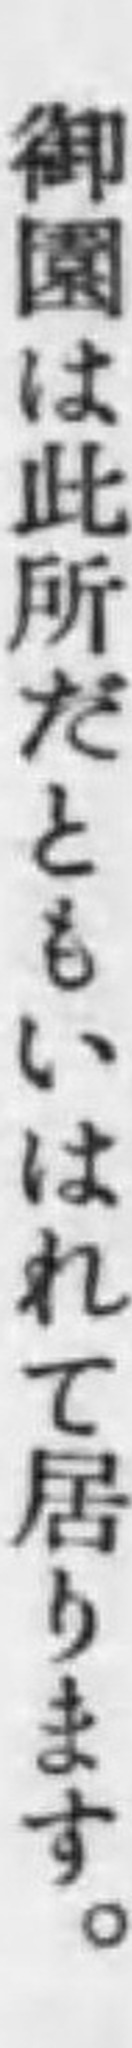御園は此所だともいはれて居ります。
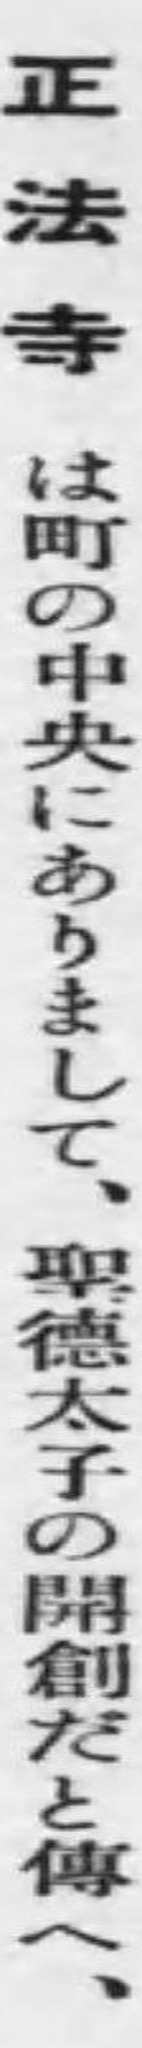正法寺は町の中央にありまして、聖徳太子の開創だと伝へ、
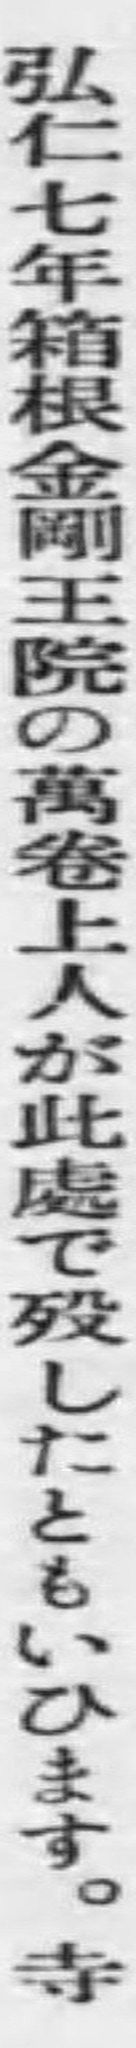弘仁七年箱根金剛王院の万巻上人が此処で歿したともいひます。寺
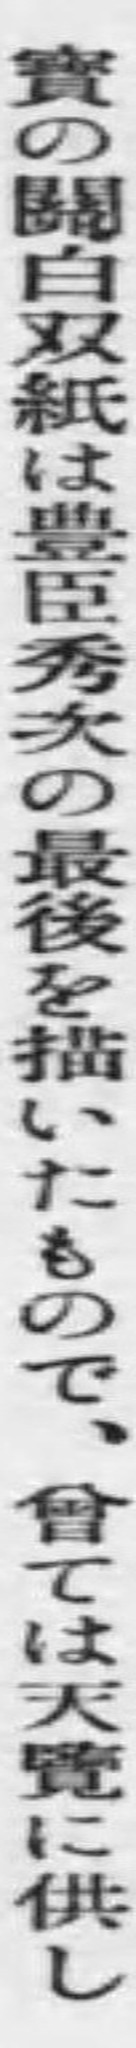宝の関白双紙は豊臣秀次の最後を描いたもので、曽ては天覧に供し
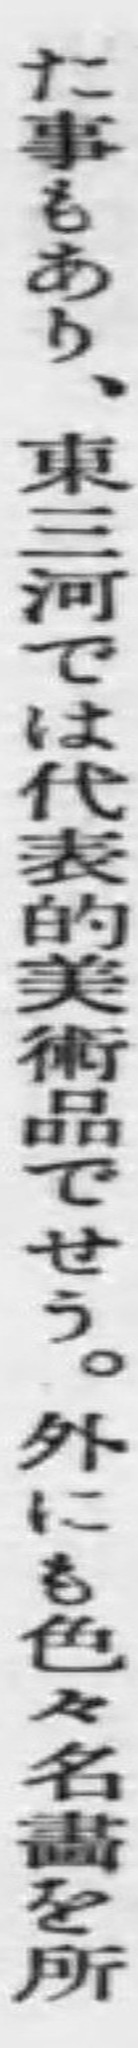た事もあり、東三河では代表的美術品でせう。外にも色々名画を所
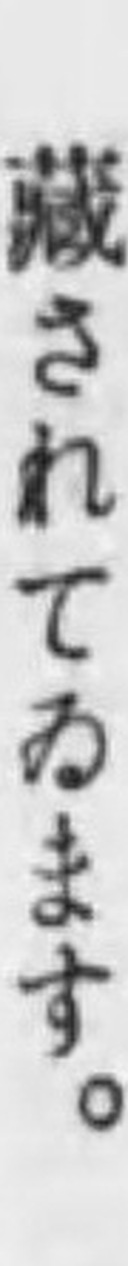蔵されてゐます。
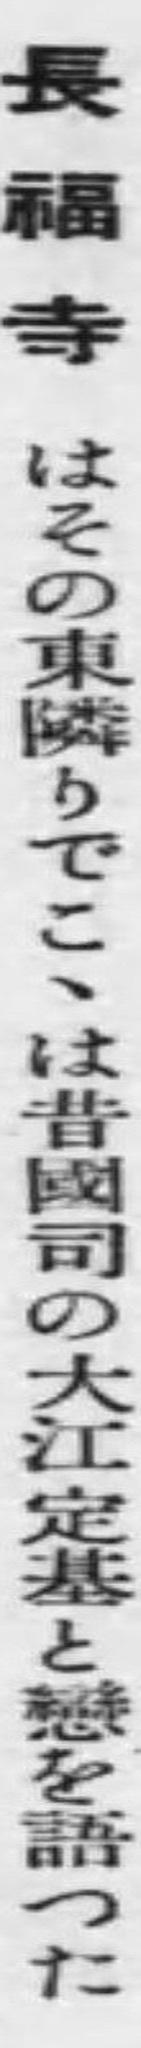長福寺はその東隣りでこゝは昔国司の大江定基と恋を語つた
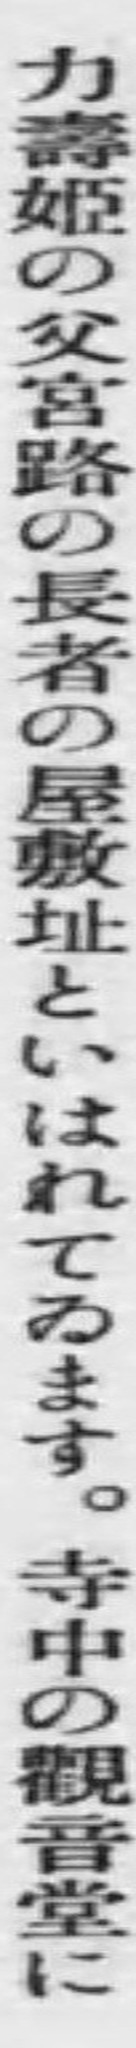力寿姫の父宮路の長者の屋敷址といはれてゐます。寺中の観音堂に
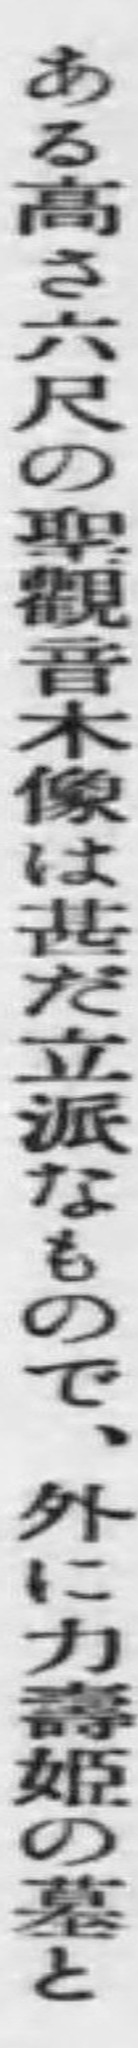ある高さ六尺の聖観音木像は甚だ立派なもので、外に力寿姫の墓と
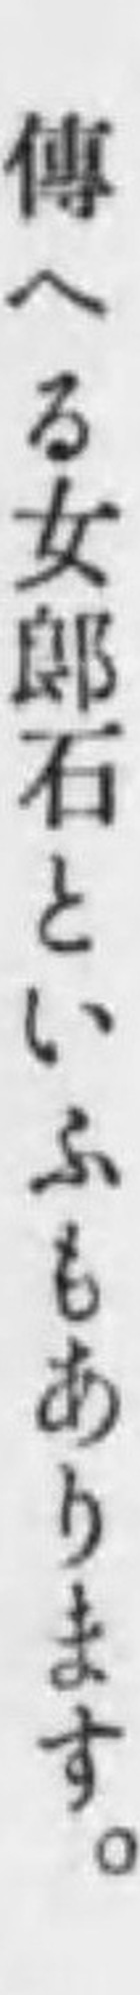伝へる女郎石といふもあります。
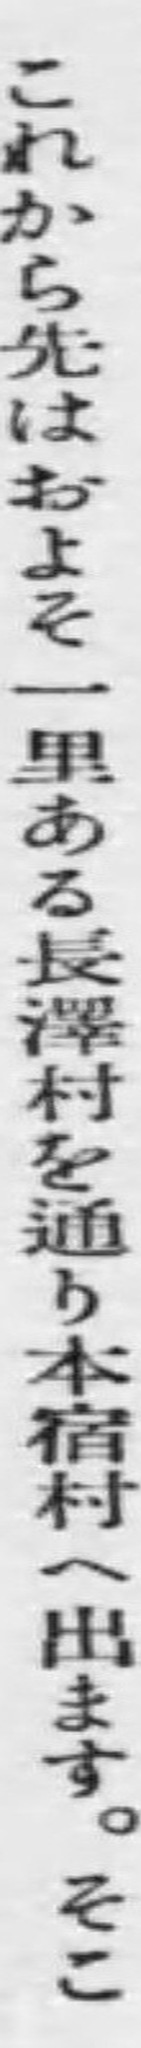これから先はおよそ一里ある長沢村を通り本宿村へ出ます。そこ
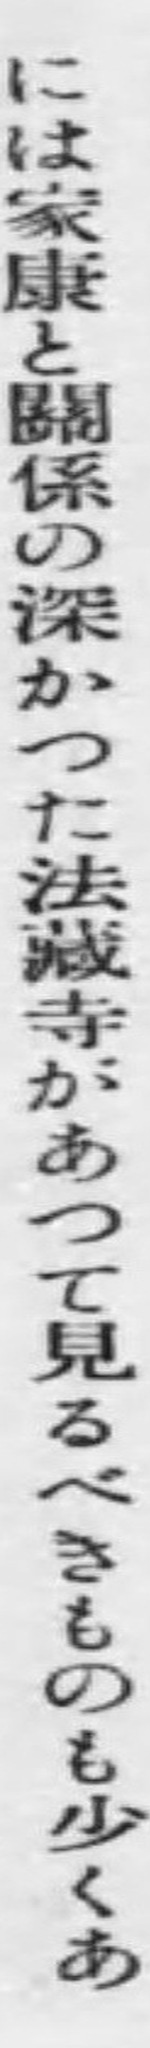には家康と関係の深かつた法蔵寺があつて見るべきものも少くあ
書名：東三河道中記 : 豊橋市及其附近案内
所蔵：国立国会図書館 National Diet Library, JAPAN
